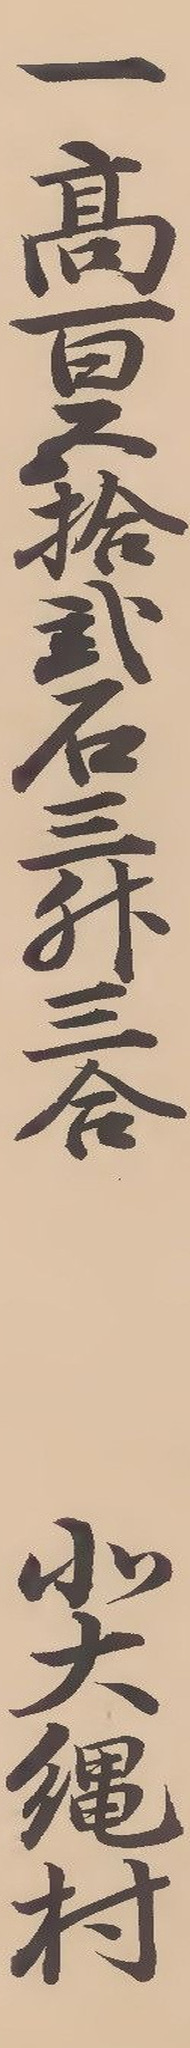一高百五拾弐石三升三合北大縄村
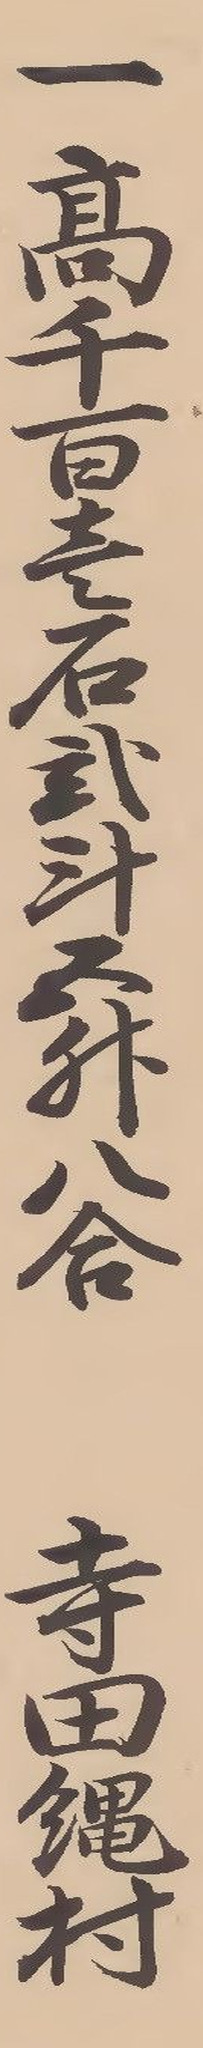一高千百壱石弐斗五升八合寺田縄村
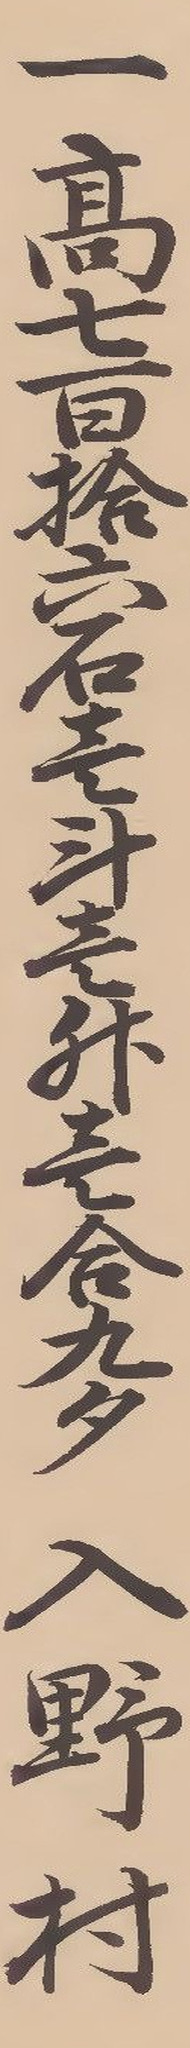一高七百拾六石壱斗壱升壱合九勺入野村
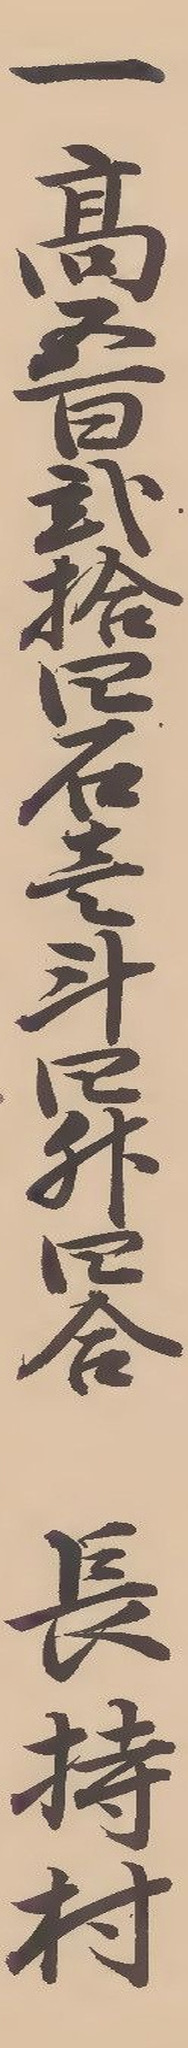一高五百弐拾四石壱斗四升四合長持村

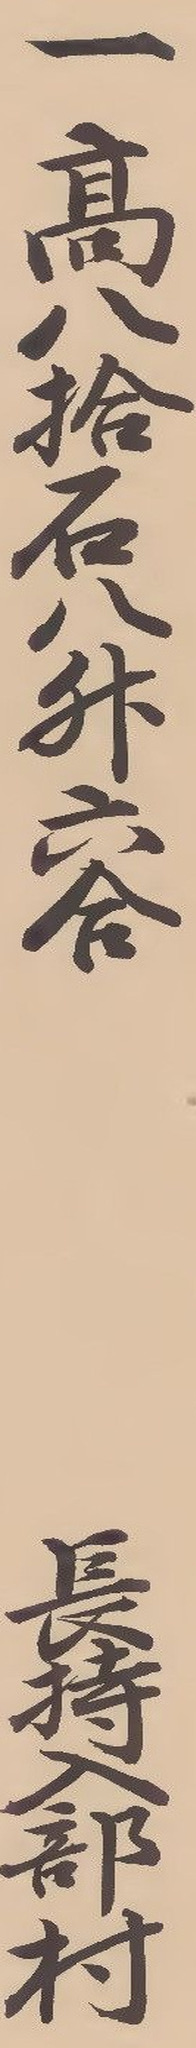一高八拾石八升六合長持入部村
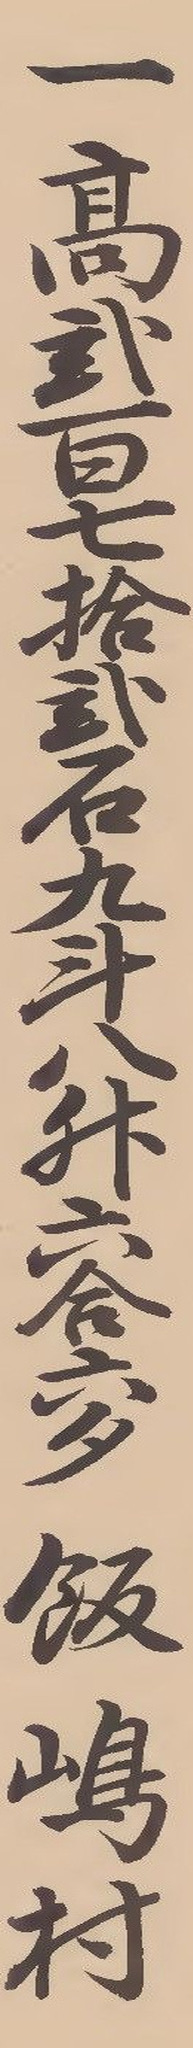一高弐百七拾弐石九斗八升六合六勺飯嶋村
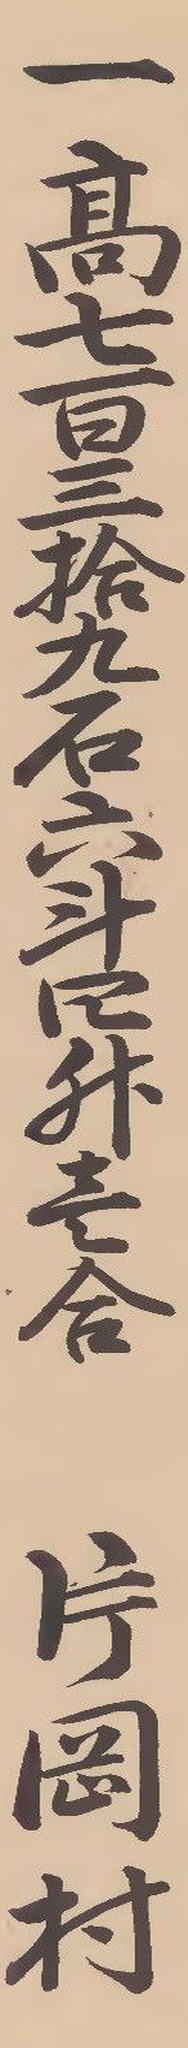一高七百三拾九石六斗四升壱合片岡村
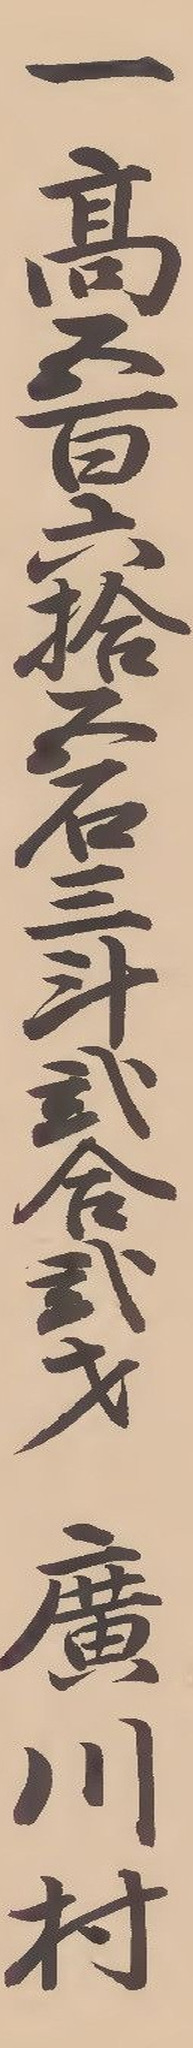一高五百六拾五石三斗弐合弐才広川村
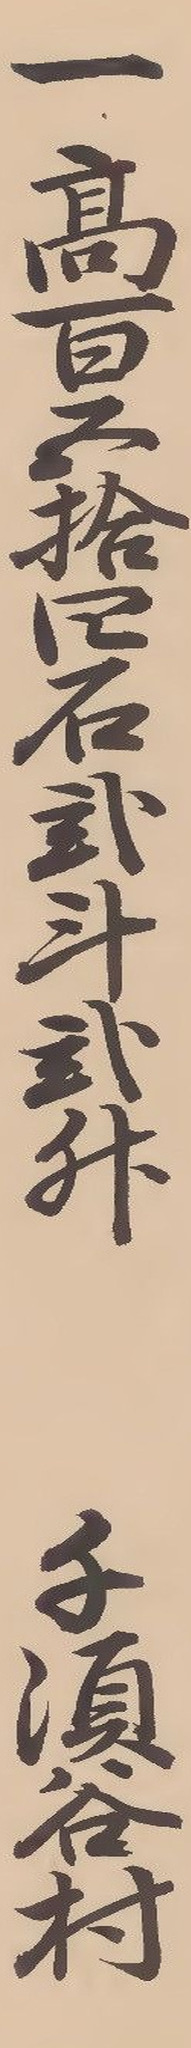一高百五拾四石弐斗弐升千須谷村
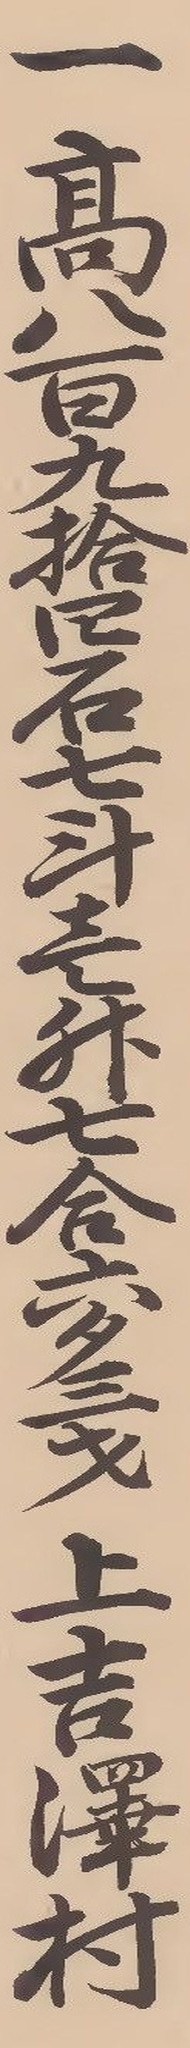一高八百九拾四石七斗壱升七合六勺三才上吉澤村
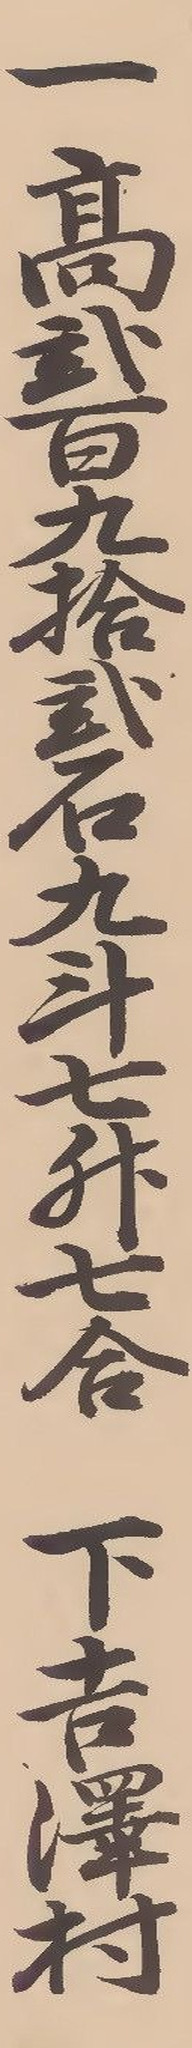一高弐百九拾弐石九斗七升七合下吉澤村
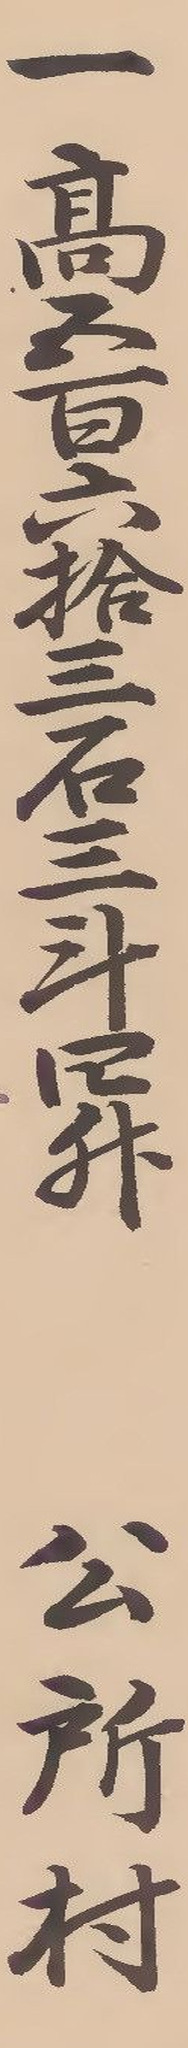一高五百六拾三石三斗四升公所村

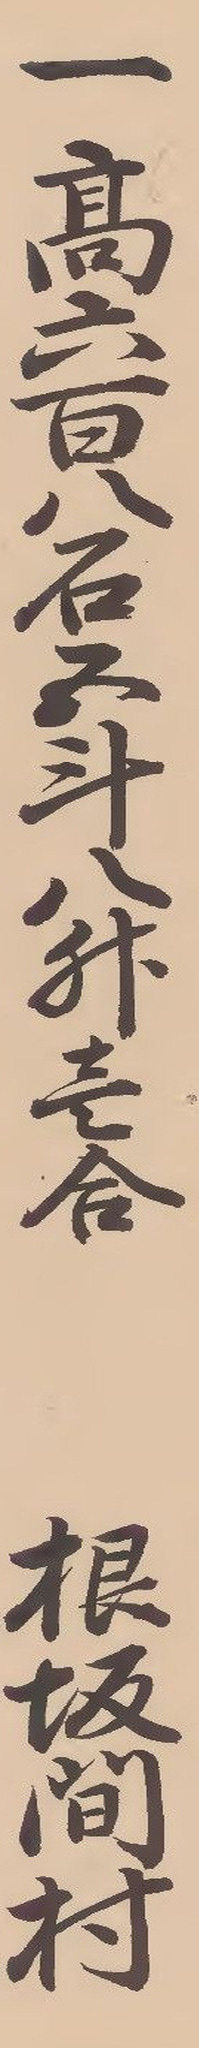一高六百八石五斗八升壱合根坂間村
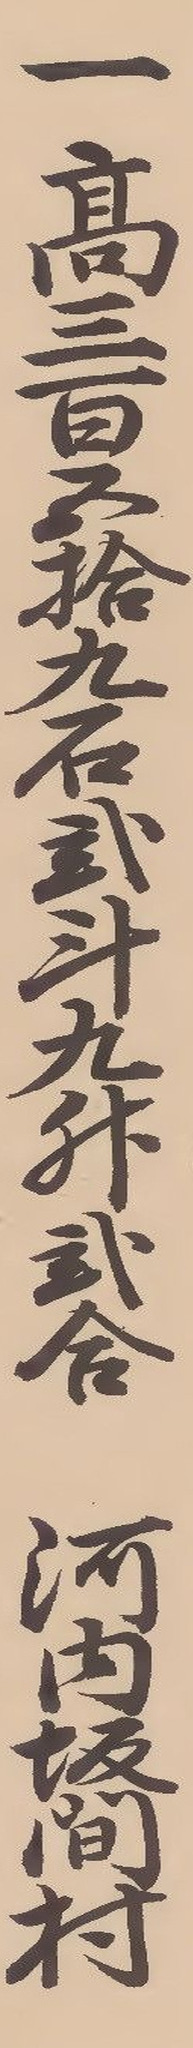一高三百五拾九石弐斗九升弐合河内坂間村
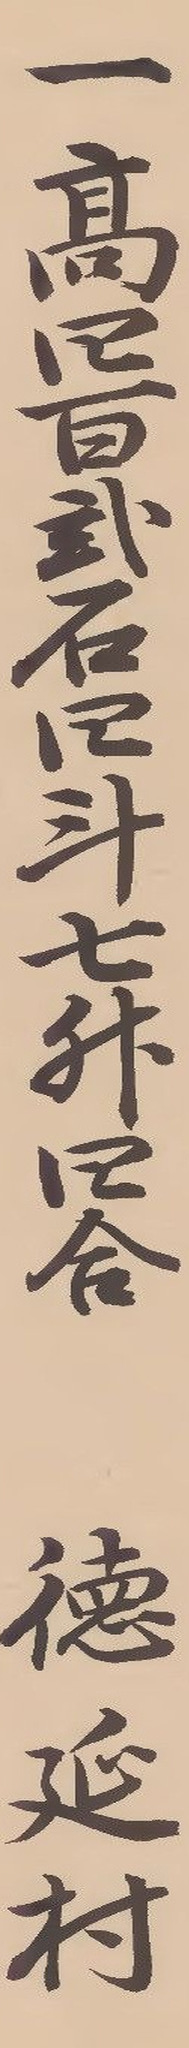一高四百弐石四斗七升四合徳延村
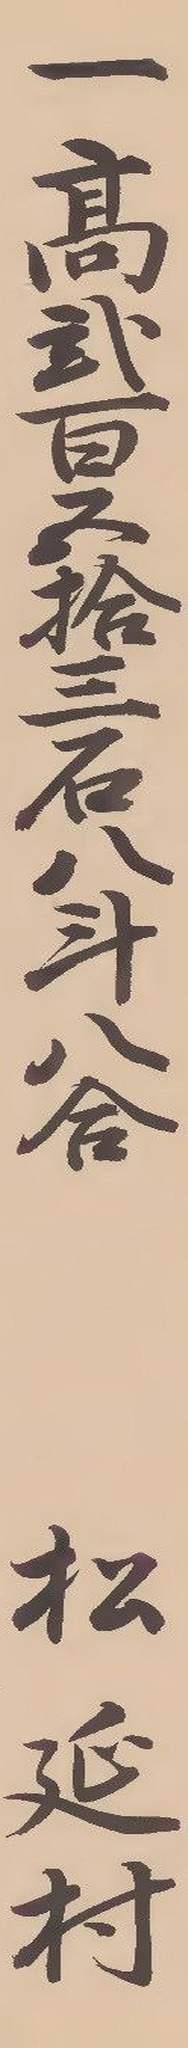一高弐百五拾三石八斗八合松延村
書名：相模国郷帳
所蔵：国立公文書館 National Archives of Japan
